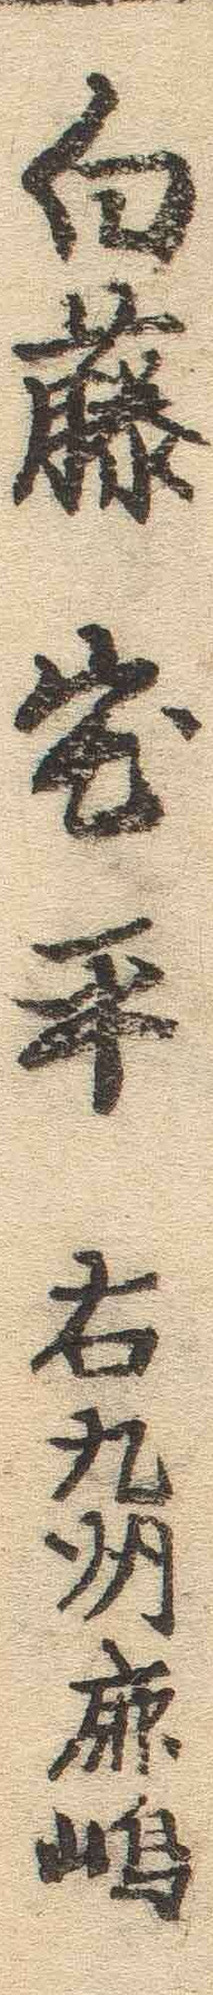白藤宅平右九州鹿島
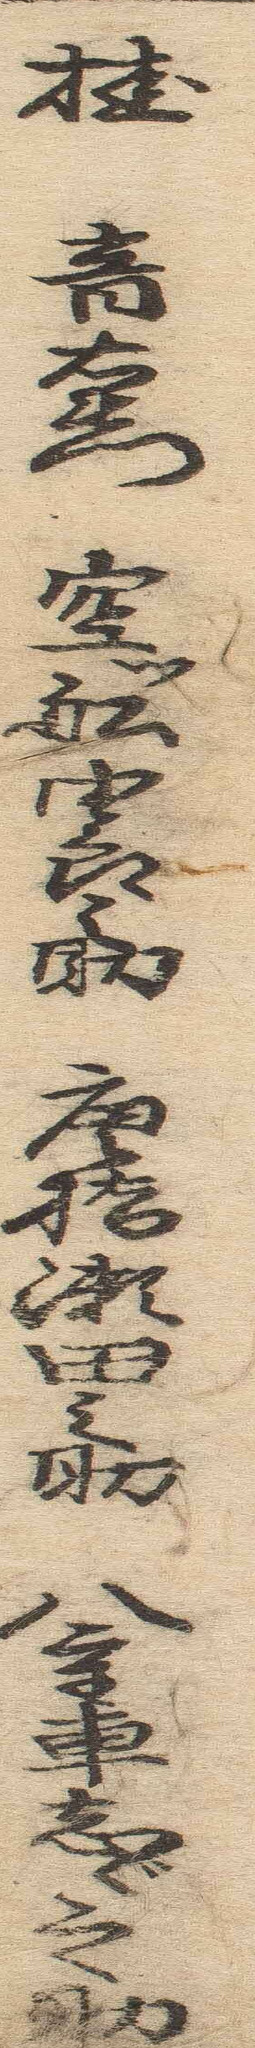林音右衛門空ッ船由良之助唐橋瀬田之助八重車志ゞ之助
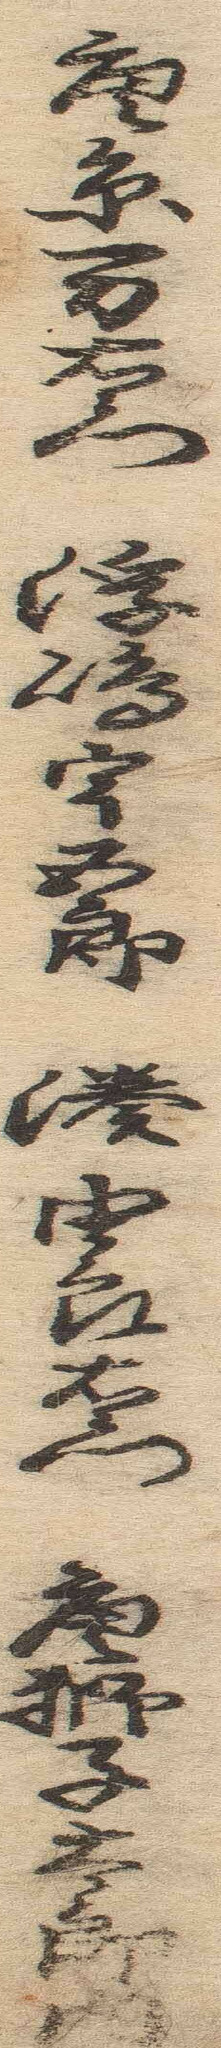唐糸勇右衛門浮嶋宇五郎湊由良右衛門唐獅子太郎助
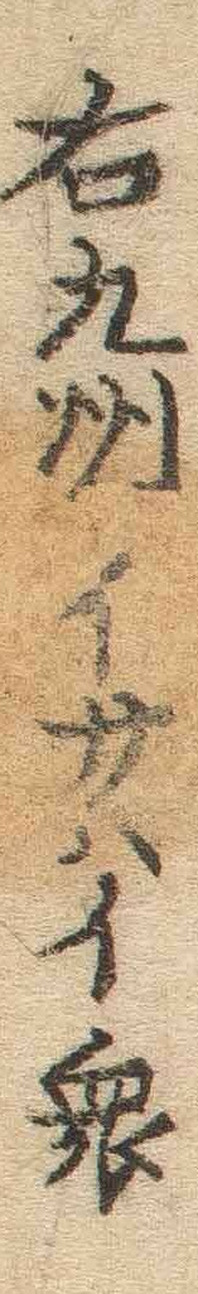右九州イサハイ衆

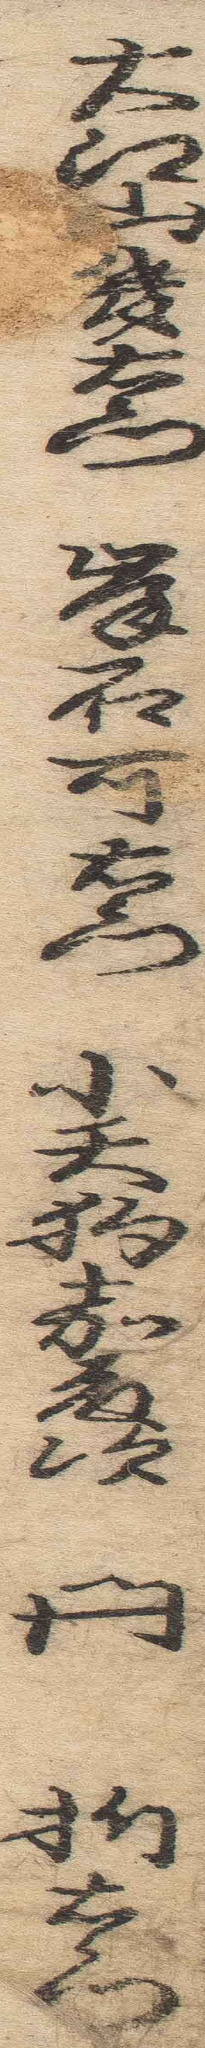大江山幾右衛門峯石可右衛門小天狗嘉藤次閂折右衛門
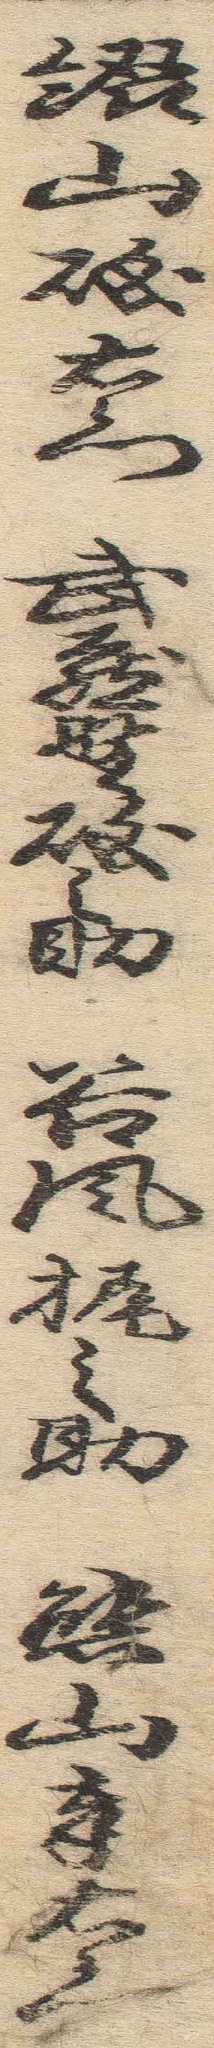錣山磯右衛門武蔵野磯之助谷風梶之助熊山幸右衛門
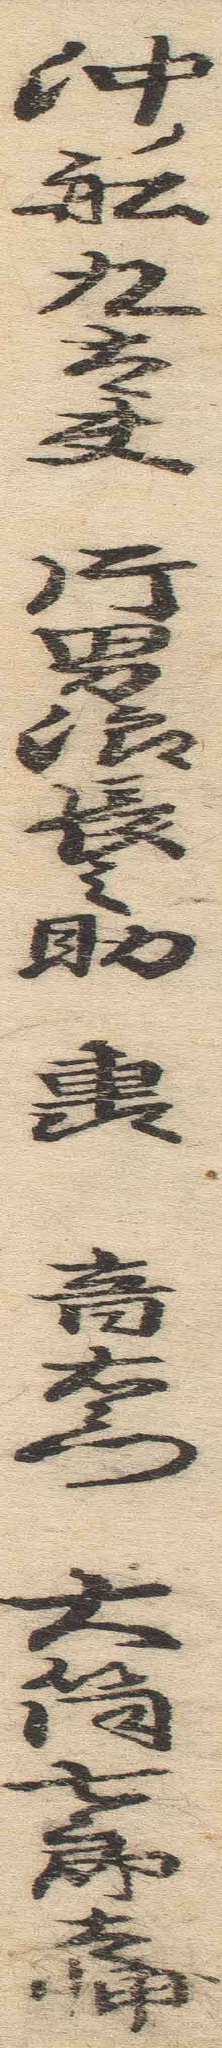沖ノ船九太夫片男波長之助轟音右衛門大筒七郎太輔
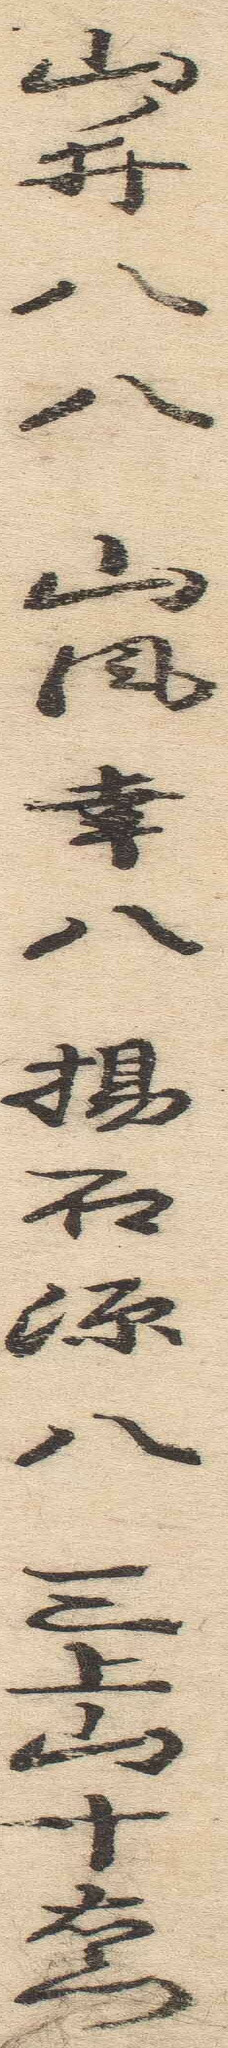山ノ井八八山風幸八揚石源八三上山十右衛門
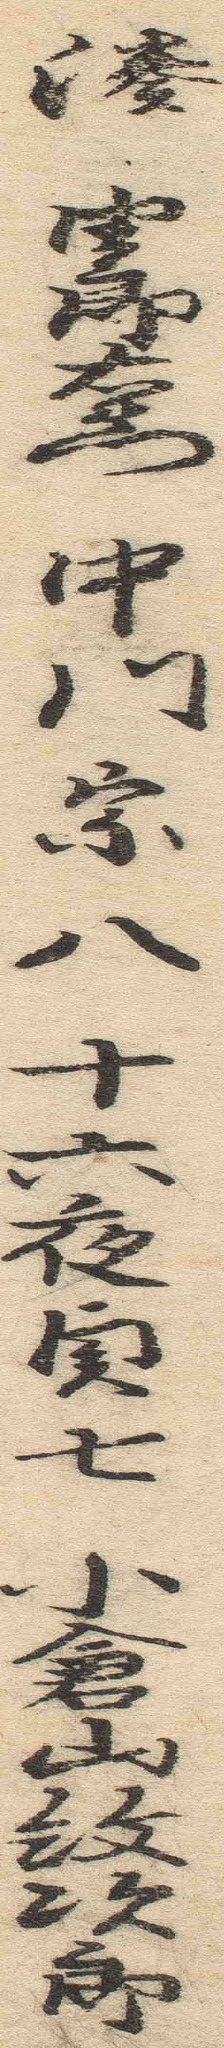湊由郎右衛門中川宋八十六夜実七小倉山紋次郎
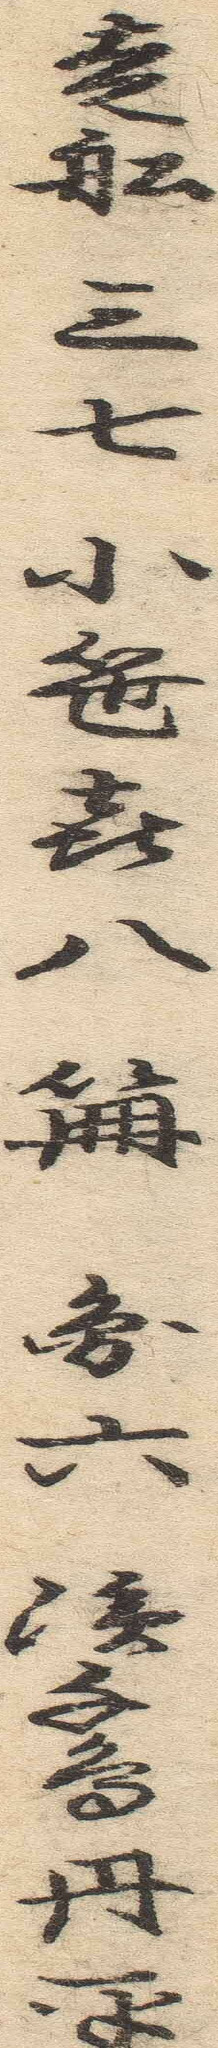走船三七小笹喜八笧円六湊千鳥丹平
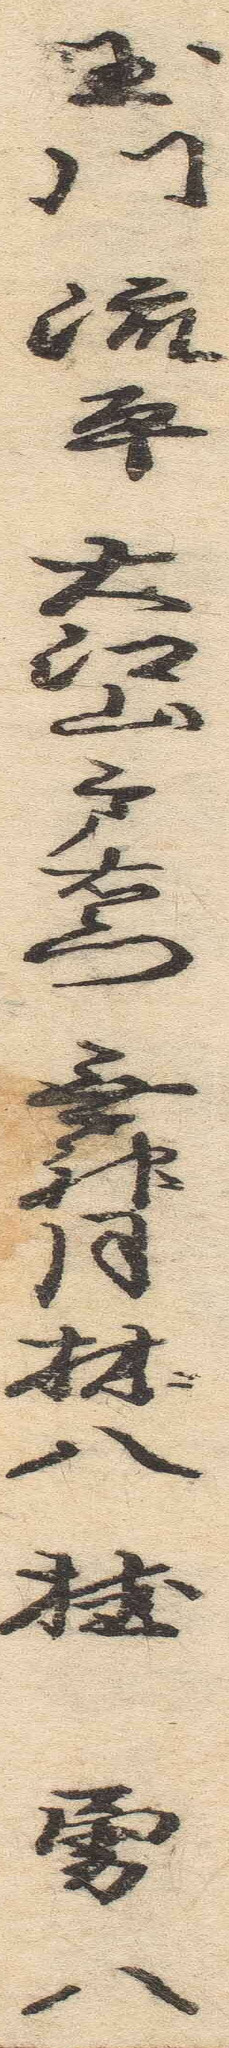玉川流平大江山戸右衛門無神月林八植勇八
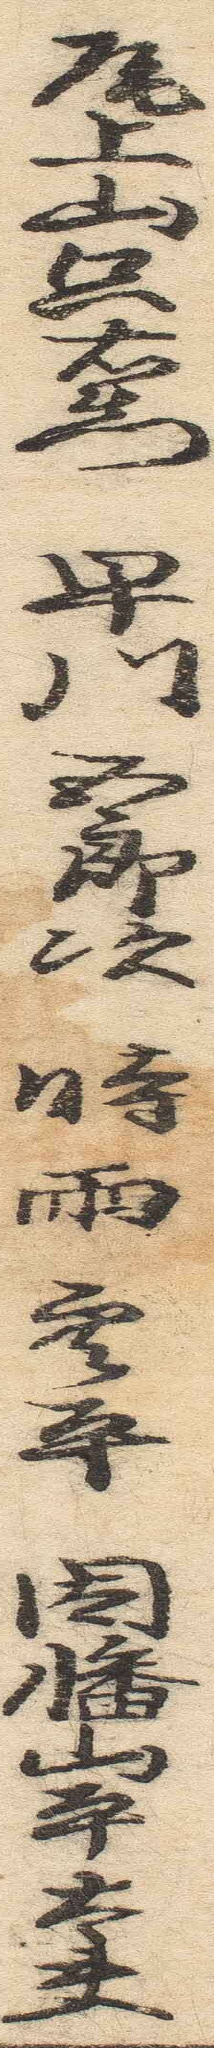尾上山只右衛門早川五郎次時雨寒平因幡山平太夫
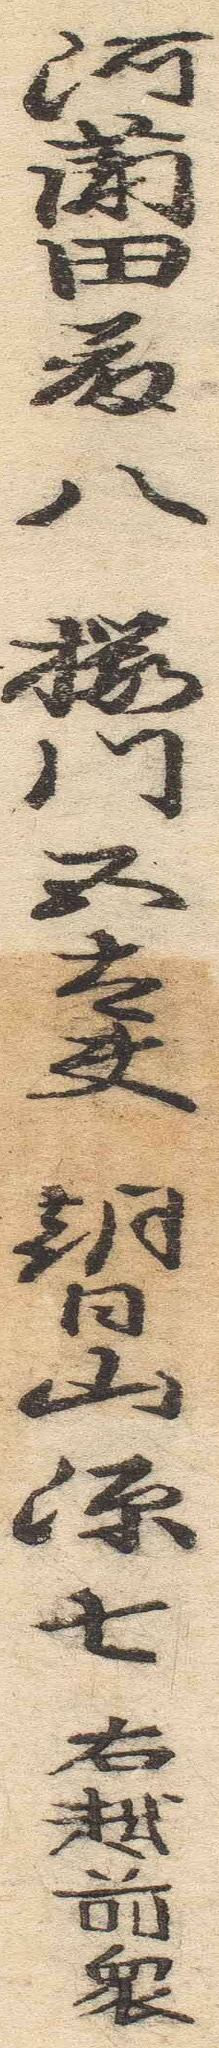河菌田藤八桜川五太夫朝日山源七右越前衆
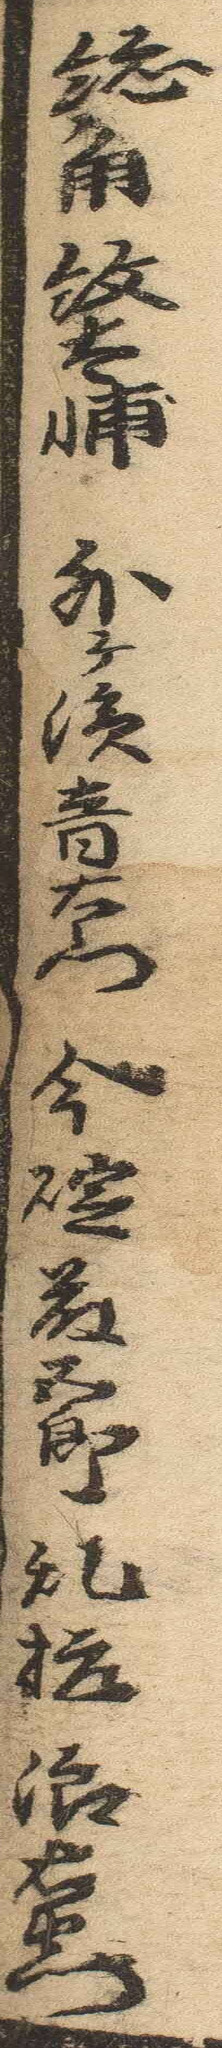総角紋太輔外ケ浜音右衛門今碇藤五郎乱杭浪右衛門
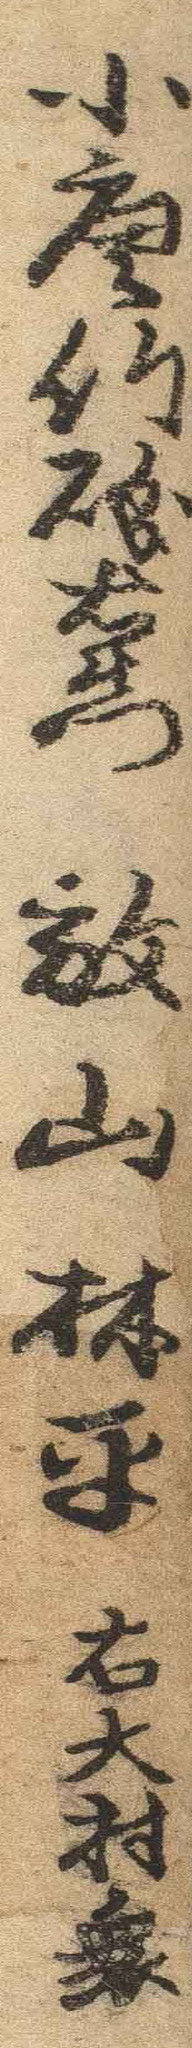小唐竹磯右衛門放山林平右大村衆
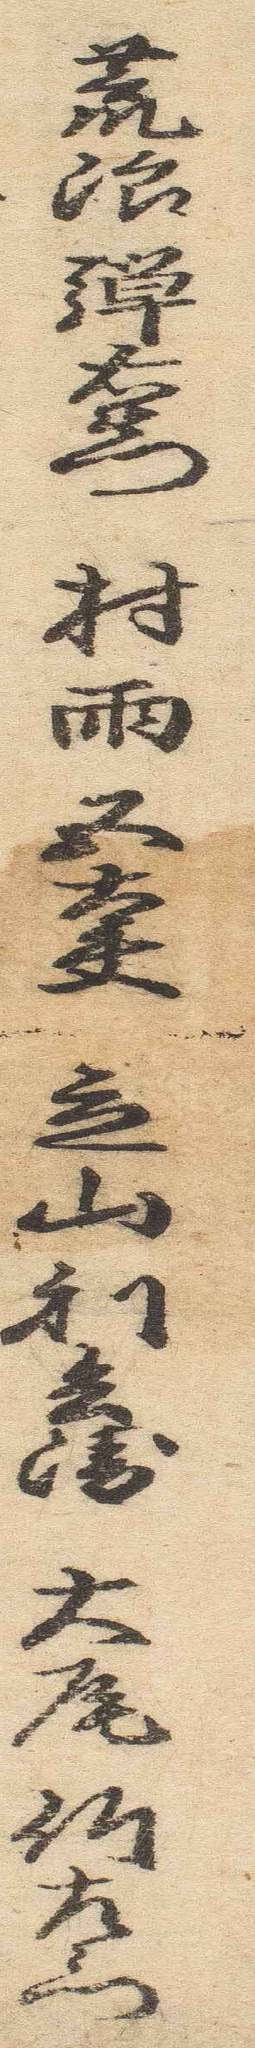荒浪弾右衛門村雨五太夫立山利兵衛大尾竹左衛門
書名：古今相撲大全
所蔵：東京学芸大学附属図書館 国文学研究資料館
